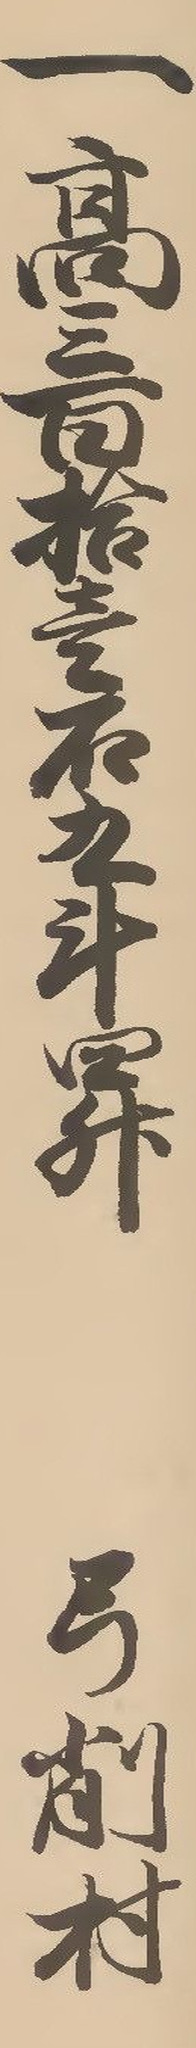一髙三百拾壱石九斗四升弓削村
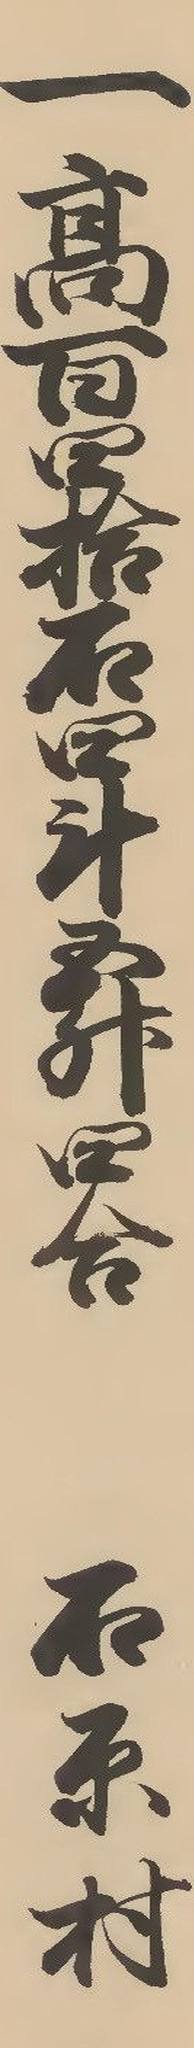一髙百四拾石四斗五升四合石原村
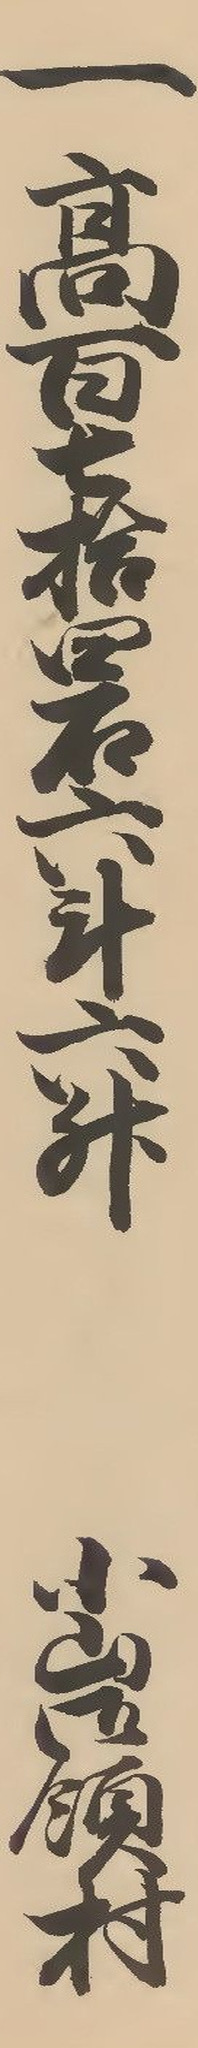一髙百七拾四石六斗六升小山御領村
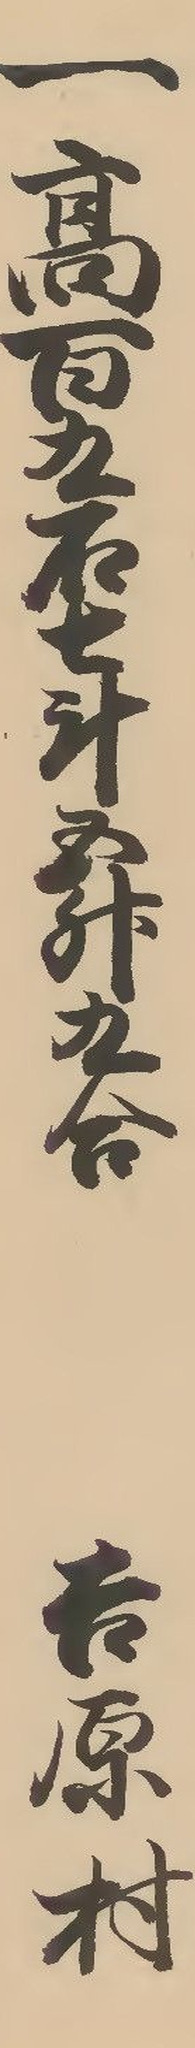一髙百九石七斗五升九合吉原村

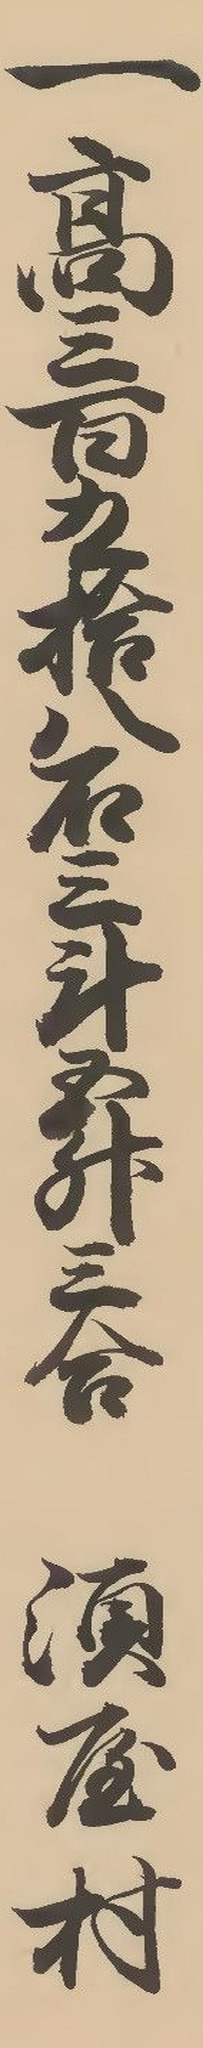一髙三百九拾八石三斗五升三合須屋村
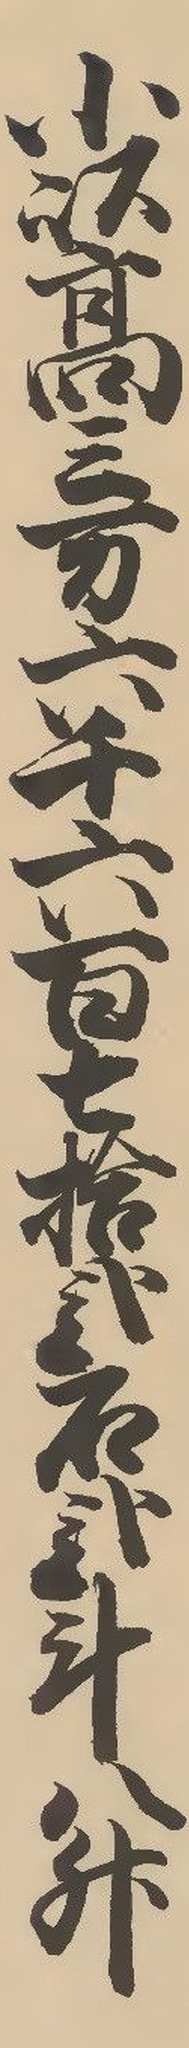小以髙三万六千六百七拾弐石弐斗八升
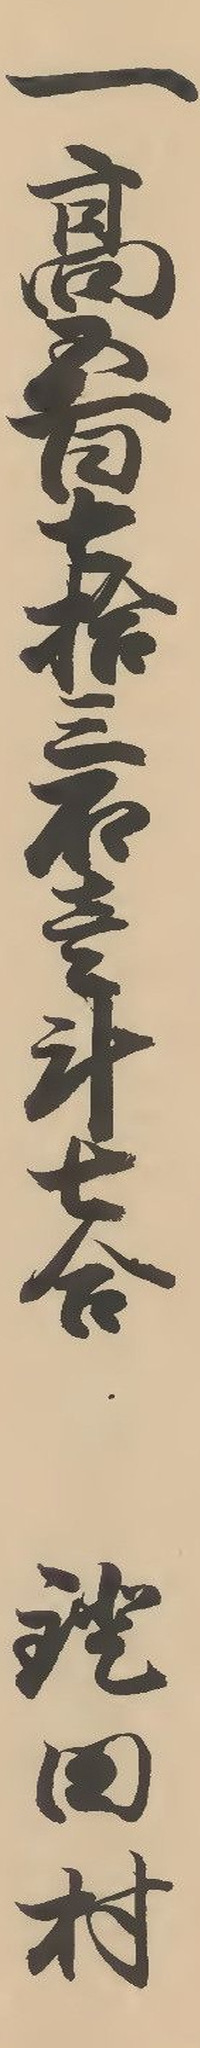一髙五百七拾三石壱斗七合鐙田村
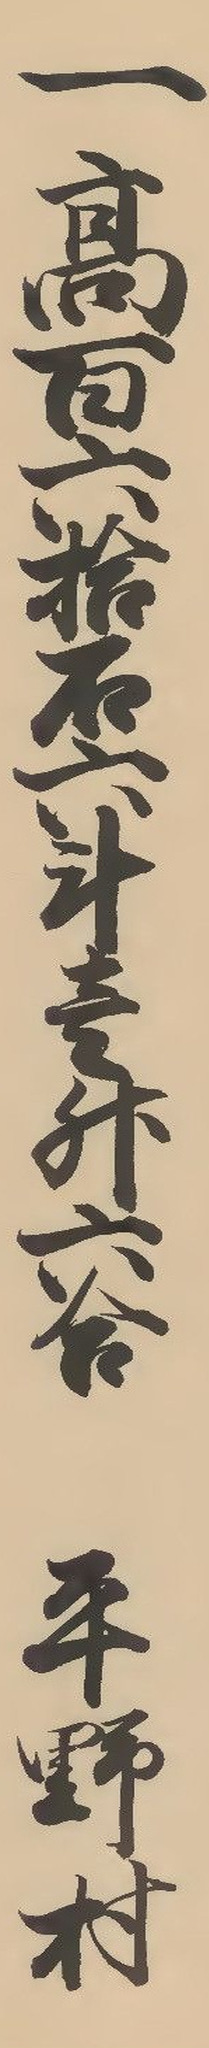一髙百六拾石六斗壱升六合平野村
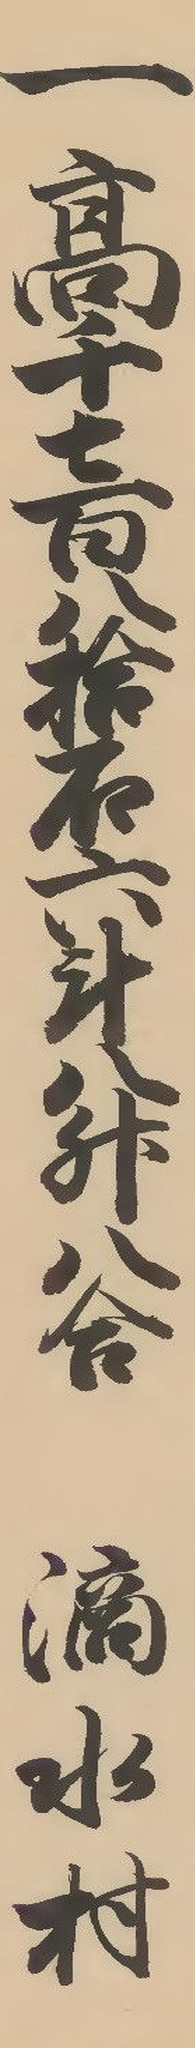一髙千七百八拾石六斗八升八合滴水村

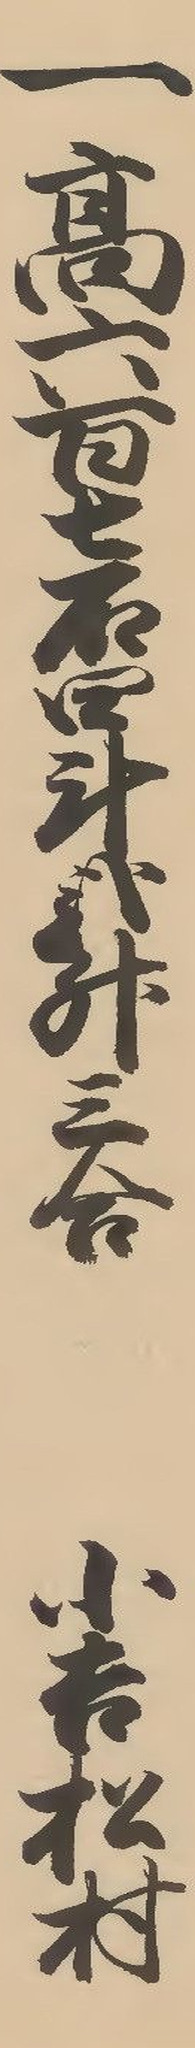一髙六百七石四斗弐升三合小吉松村
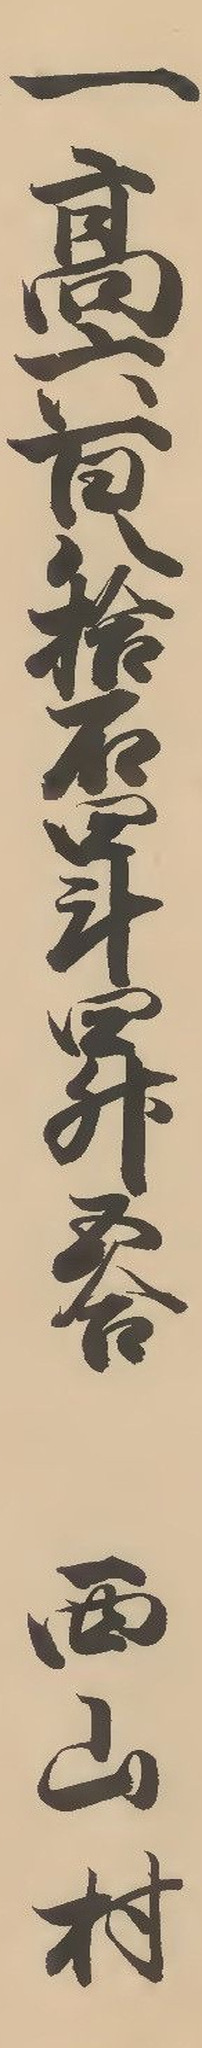一髙六百八拾石四斗四升五合西山村
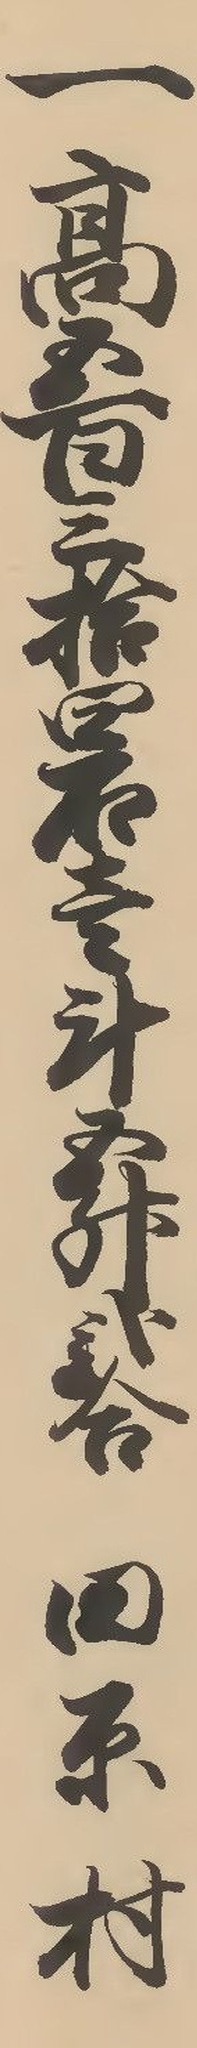一髙五百三拾四石壱斗五升弐合田原村
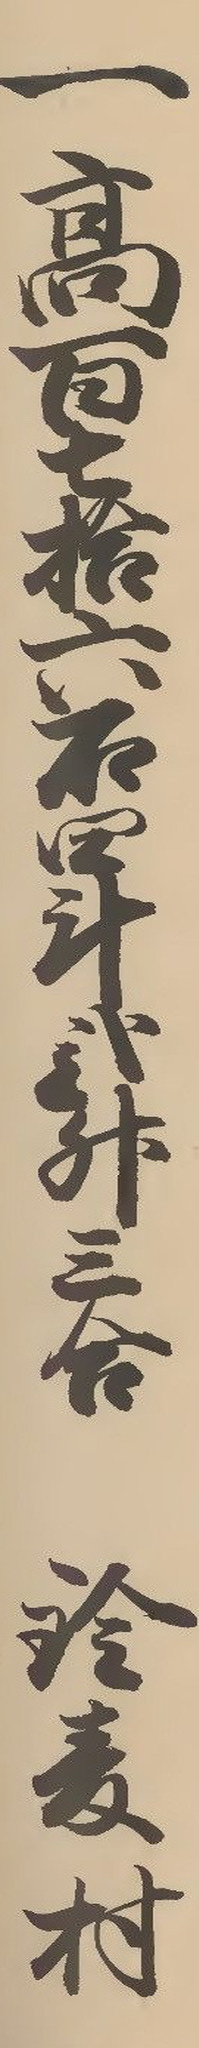一髙百七拾六石四斗弐升三合鈴麦村
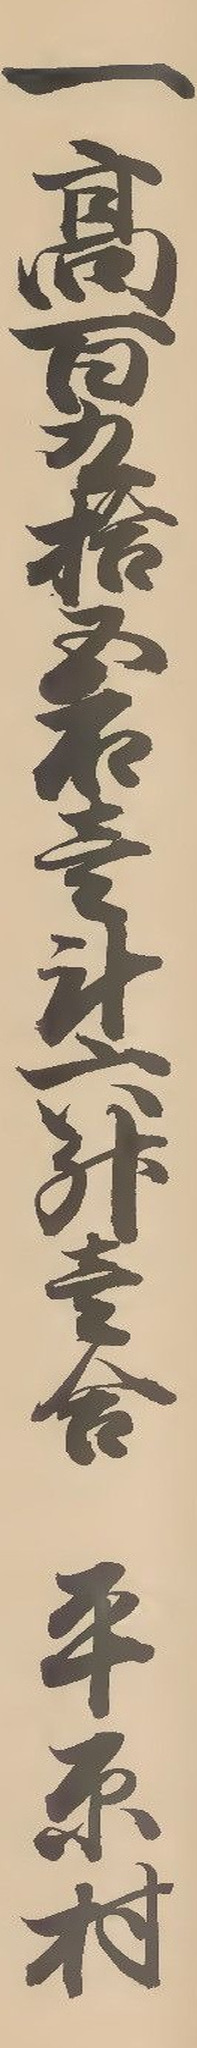一髙百九拾五石壱斗六升壱合平原村
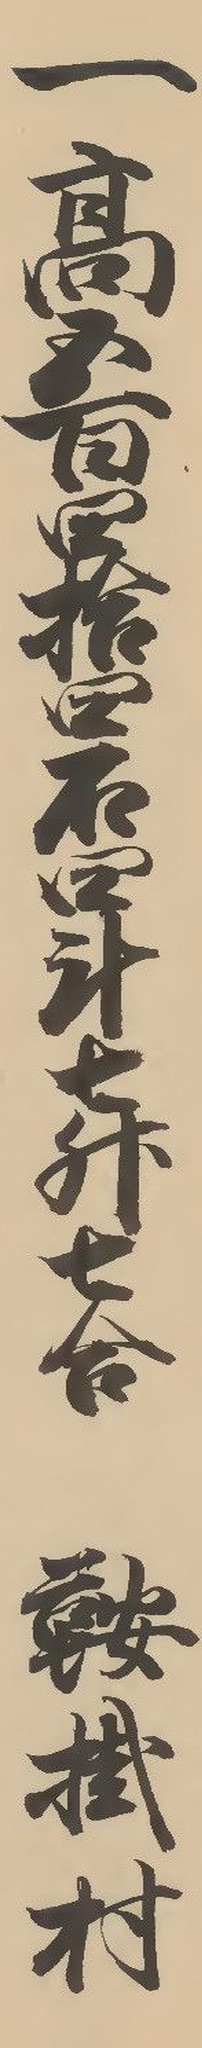一髙五百四拾四石四斗七升七合鞍掛村
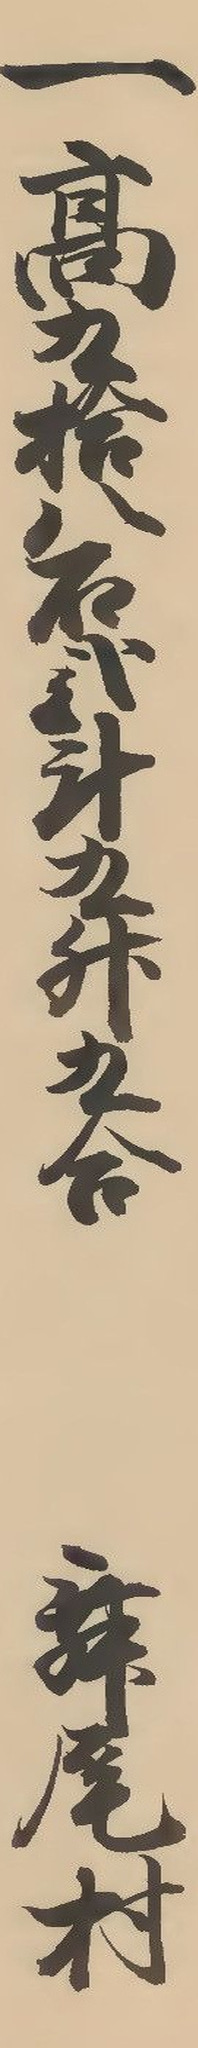一髙九拾八石弐斗九升九合舞尾村
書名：肥後国郷帳
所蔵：国立公文書館 National Archives of Japan
